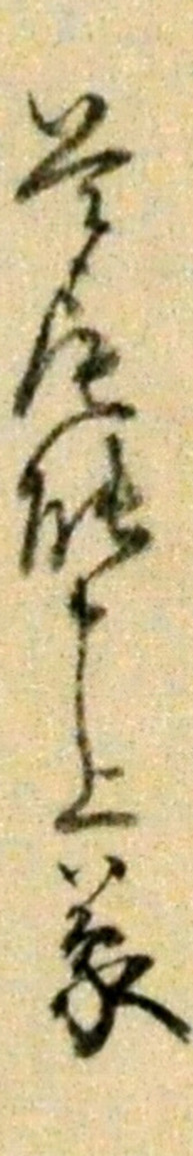首尾能申上蒙
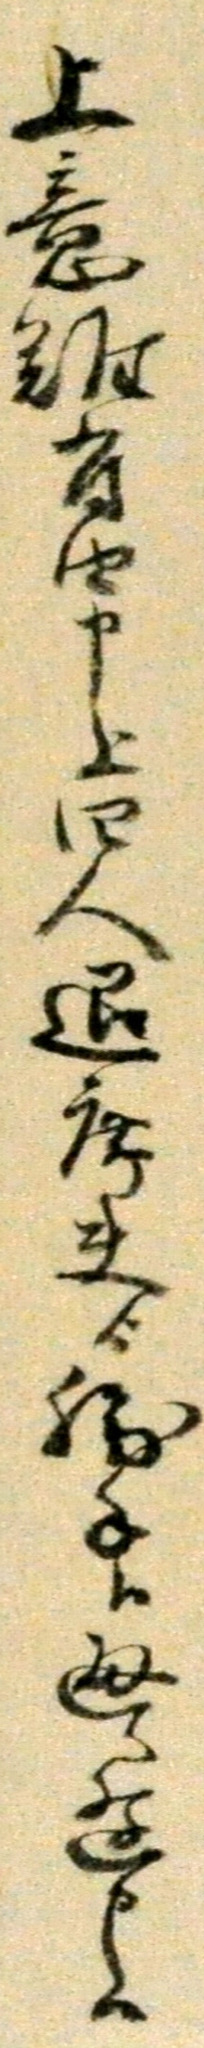上意難有由申上四人退席夫ゟ勝手江通り逢申候
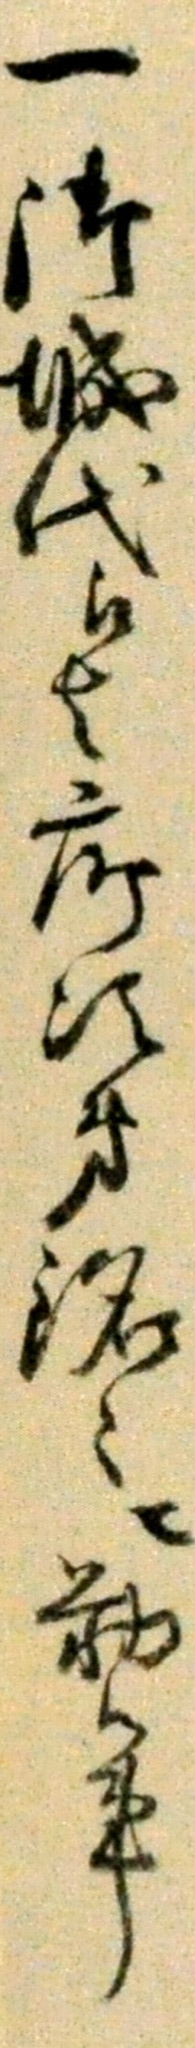一御城代江者席次第銘々ヒ勤候事

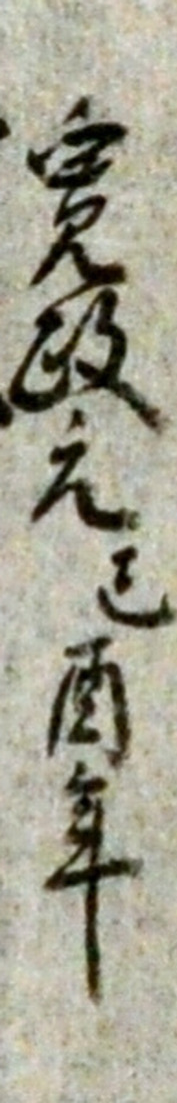寛政元己酉年
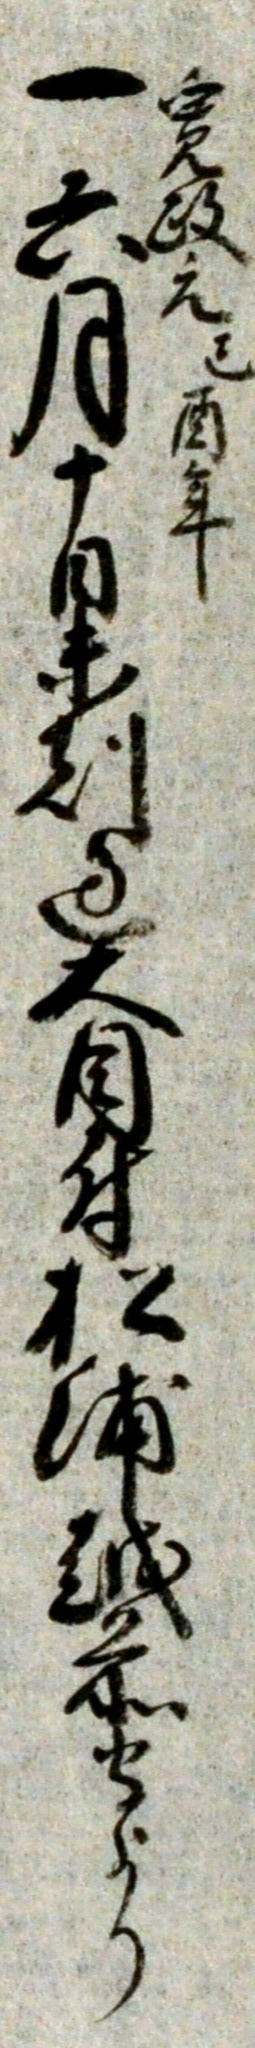一六月十日未刻過大目付松浦越前守より
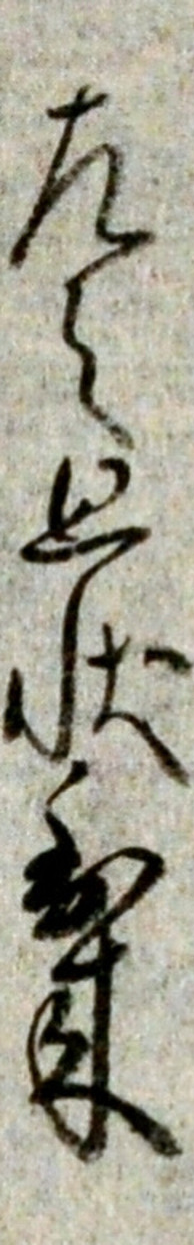左之廻状到来
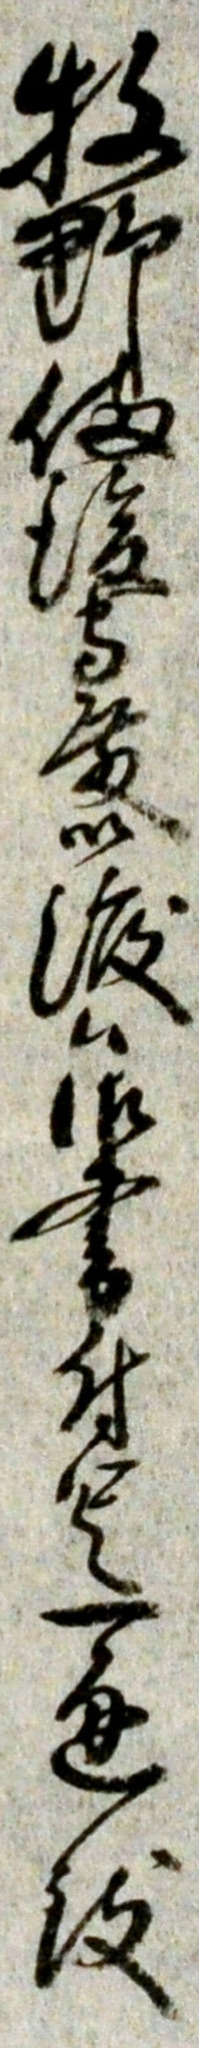牧歳備後守殿御渡候御書付写一通致
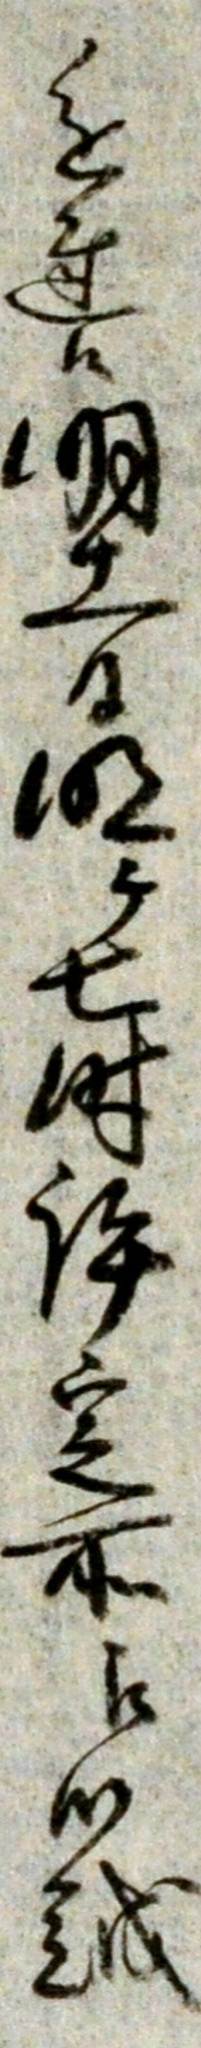進達候明十一日明ヶ七時評定所江御越
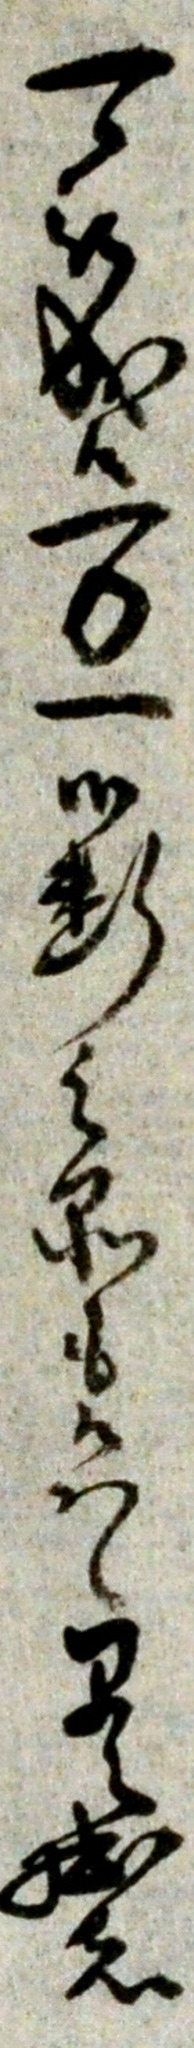可被成候万一御断之品も候ハハ早々御名
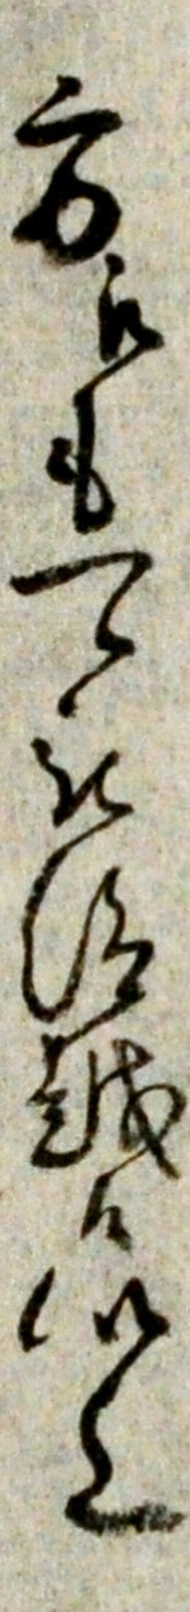方江も可被仰越候以上
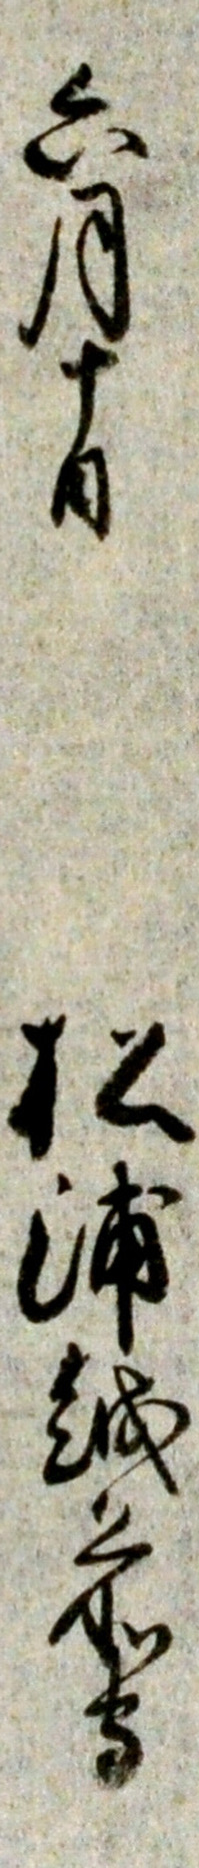六月十日松浦越前守
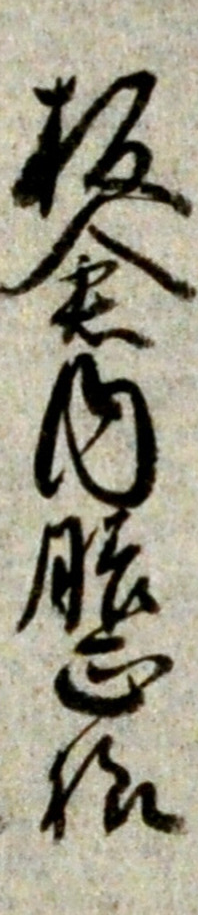板倉内膳正
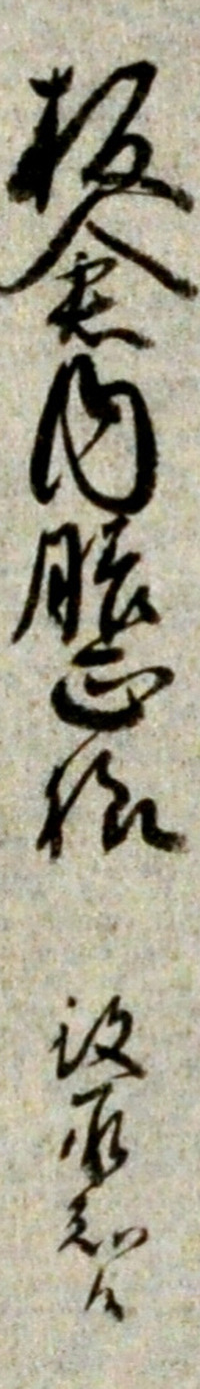板倉内膳正様致承知候
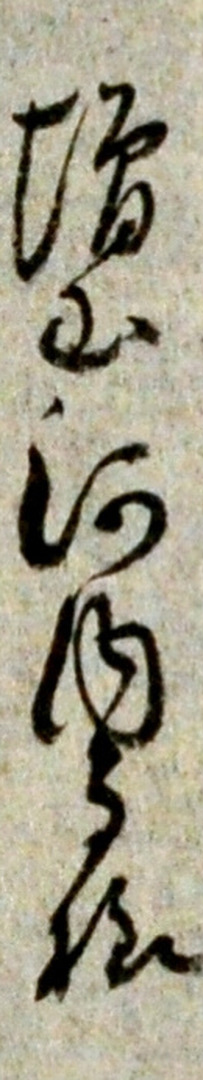増山河内守様
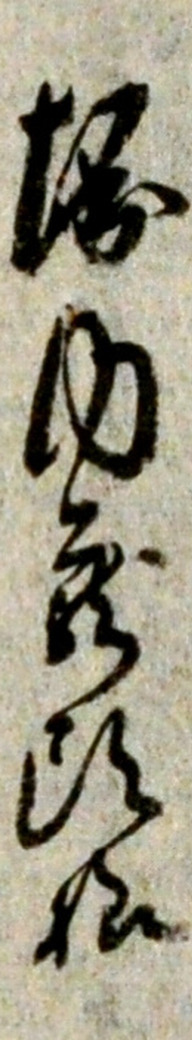堀内蔵頭様
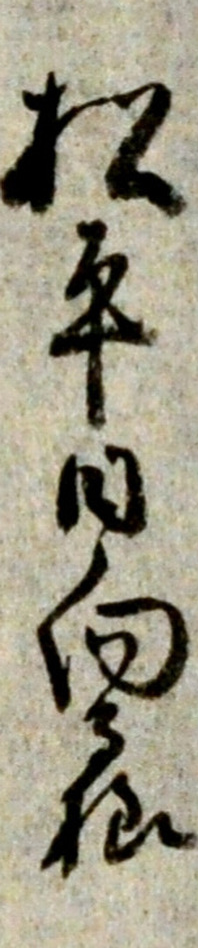松平日向守様
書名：大阪加番関係諸書留〔一括〕
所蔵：伊那市立高遠町図書館・合同会社AMANE
